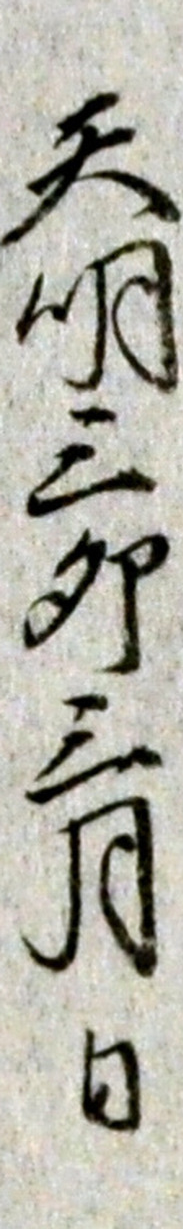天明三卯三月日
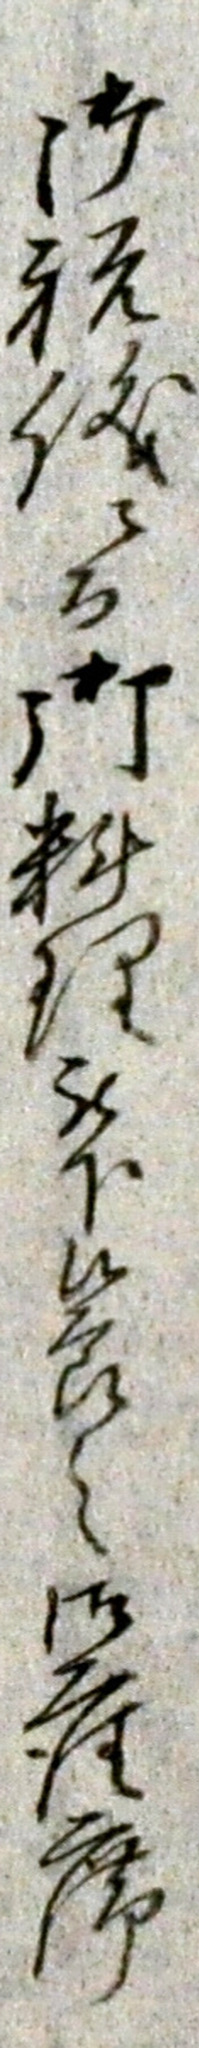御祝儀ニ而御料理被下候節之御座席
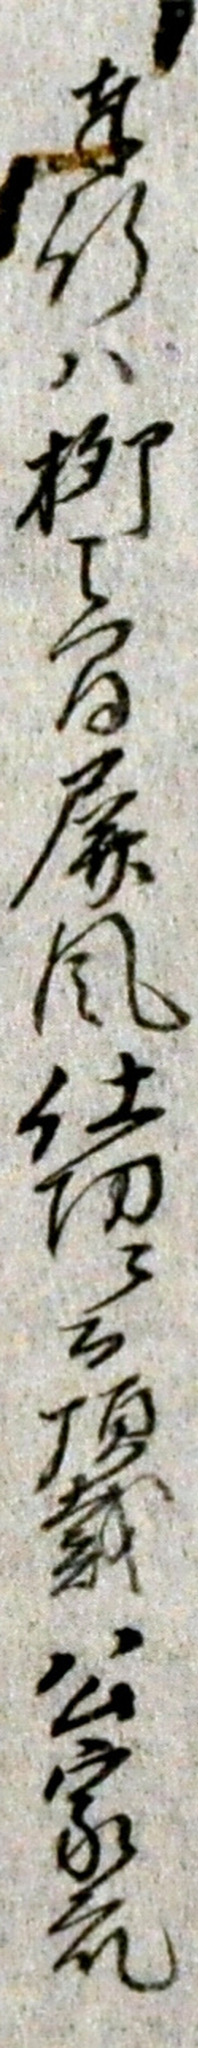奉行ハ栁之間屏風仕切ニ而頂戴公家衆
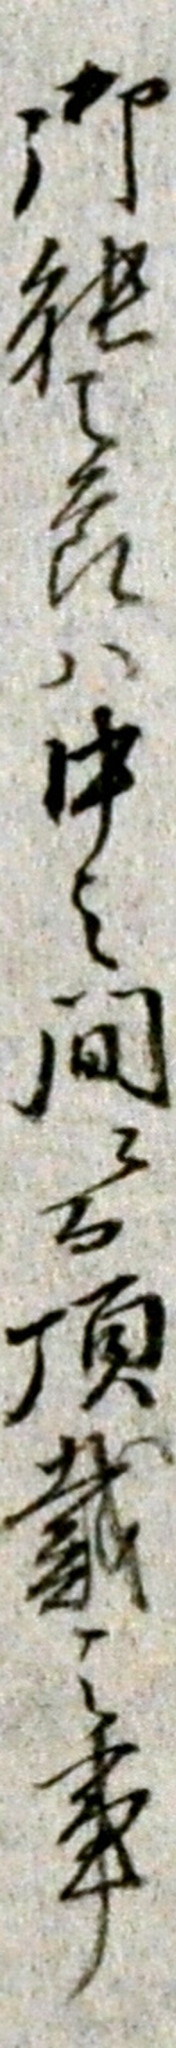御能之節ハ中之間ニ而頂戴之事

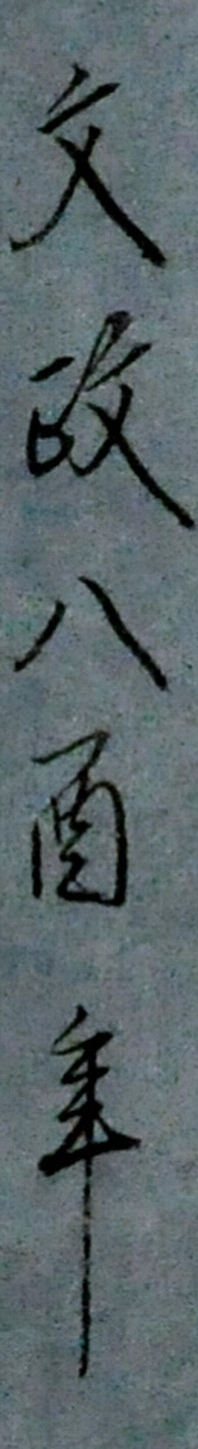文政八酉年
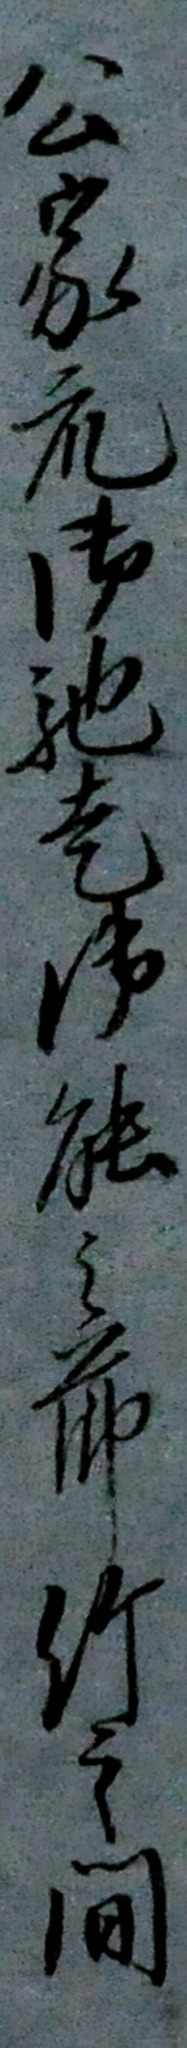公家衆御馳走御能之節竹之間
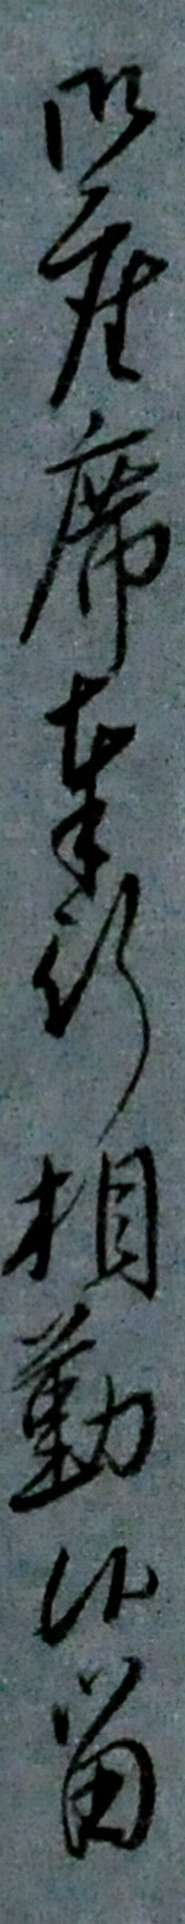御座席奉行相勤候留
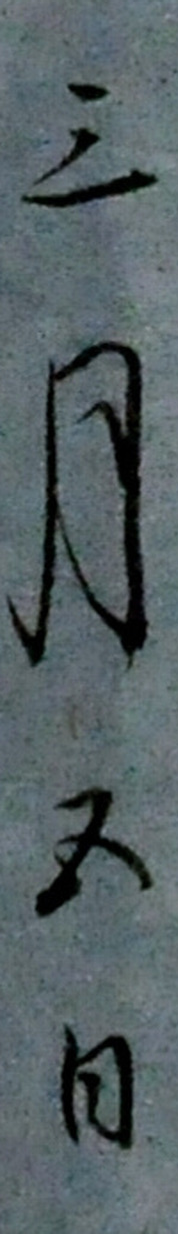三月五日
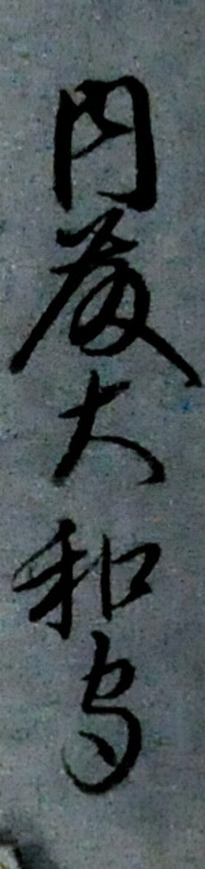内藤大和守

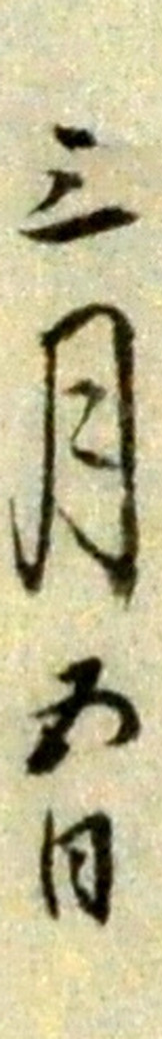三月五日
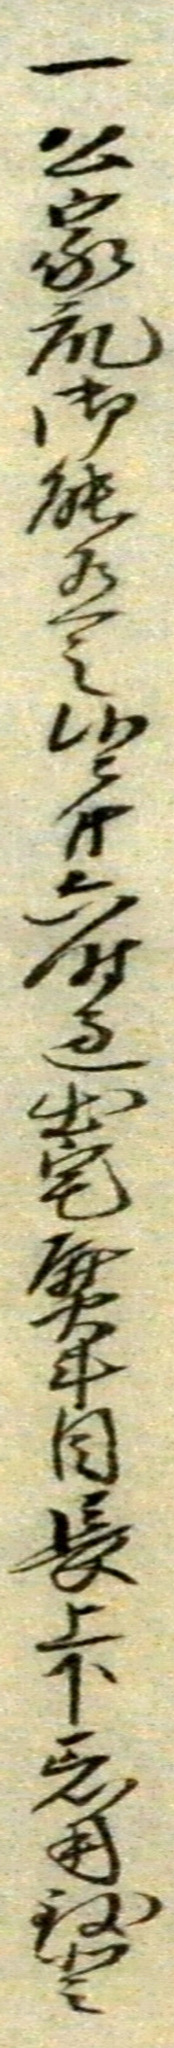一公家衆御能有之候ニ付六時過出宅熨斗目長上下着用致登
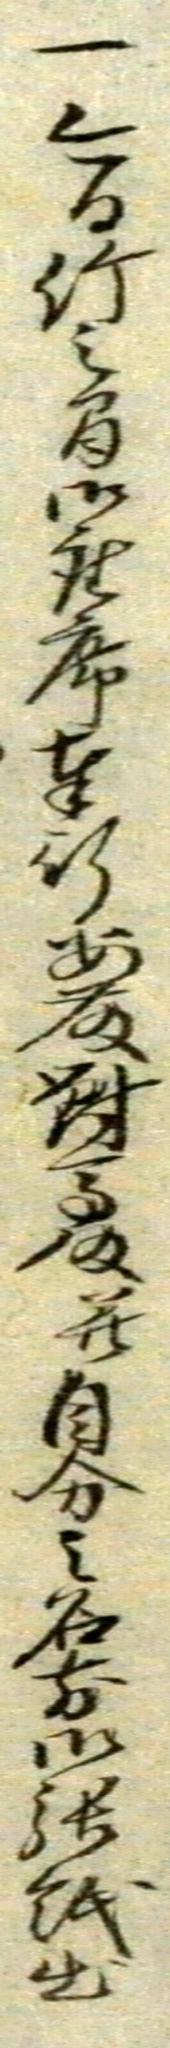一今日竹之間御座席奉行安藤對馬殿幷自分之名前御張紙出
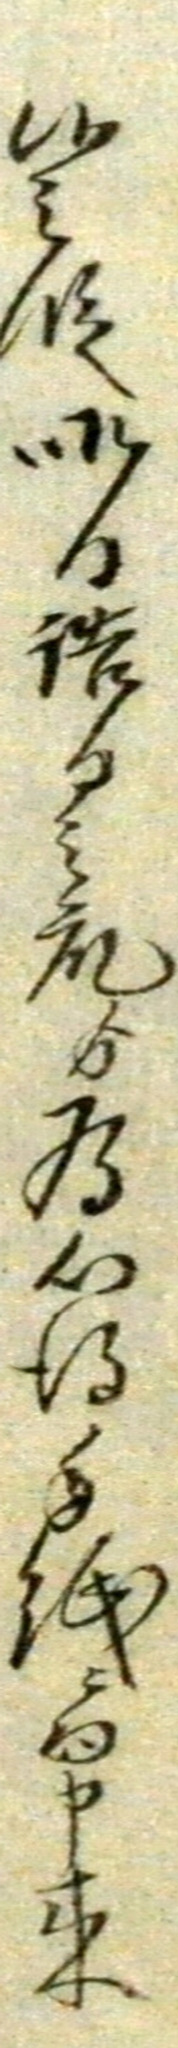候之段昨日詰日之衆ゟ為心得手紙ニ而申来
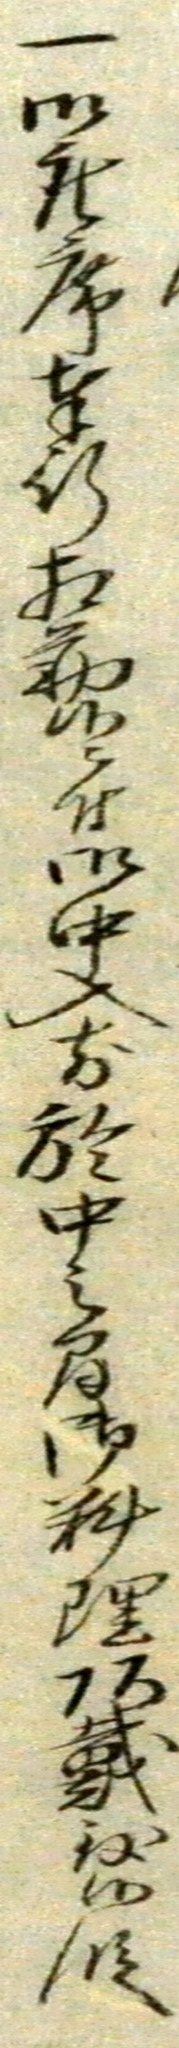一御座席奉行相勤候ニ付御中入前於中之間御料理頂戴致候段
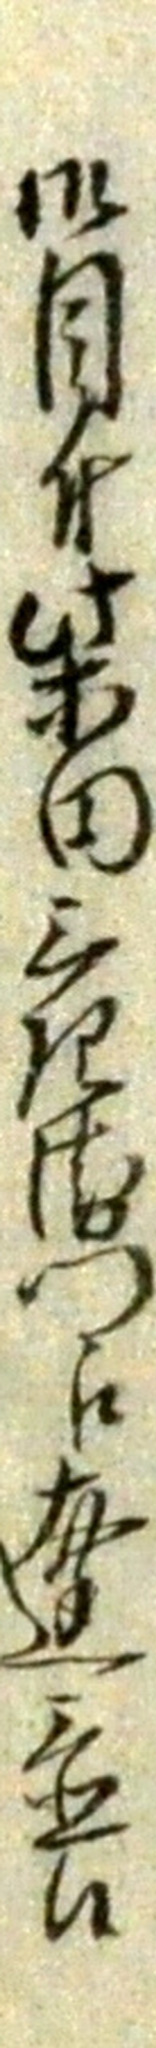御目付柴田三左衛門え達置候
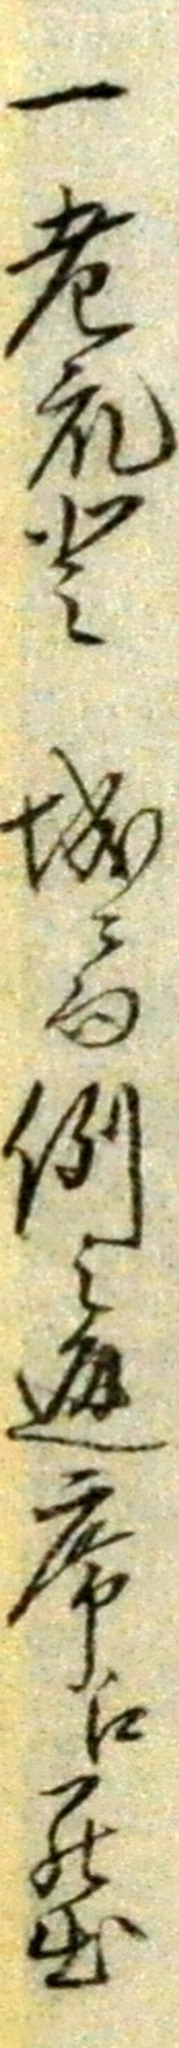一老衆登城ニ而例の通席え罷出
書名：竹ノ間御座席奉行勤方控外
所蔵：伊那市立高遠町図書館・合同会社AMANE
